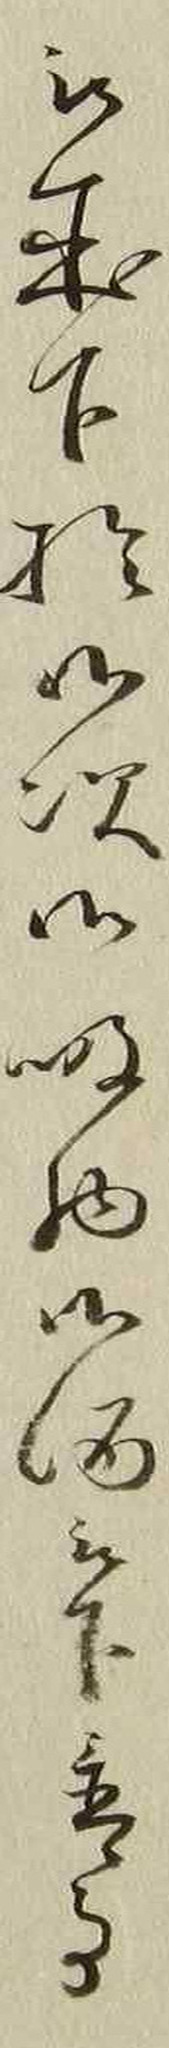被成下於御次御吸物御酒被下置候事
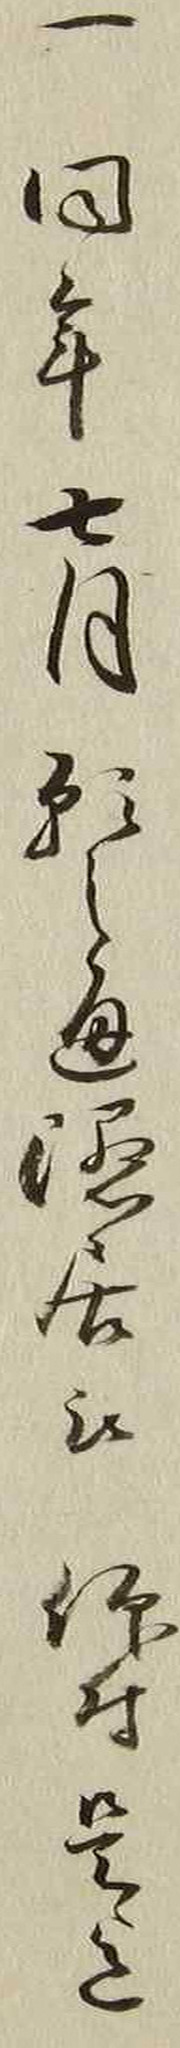一同年七月願之通隠居被仰付是迄
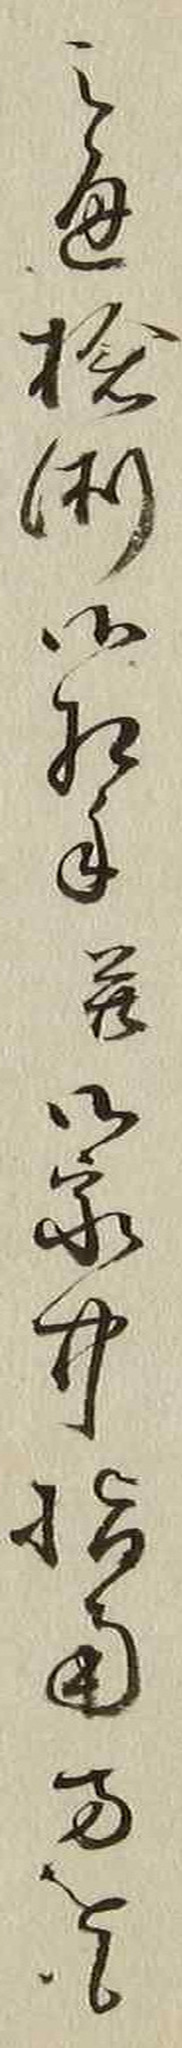之通槍術御相手并御家中指南方をも
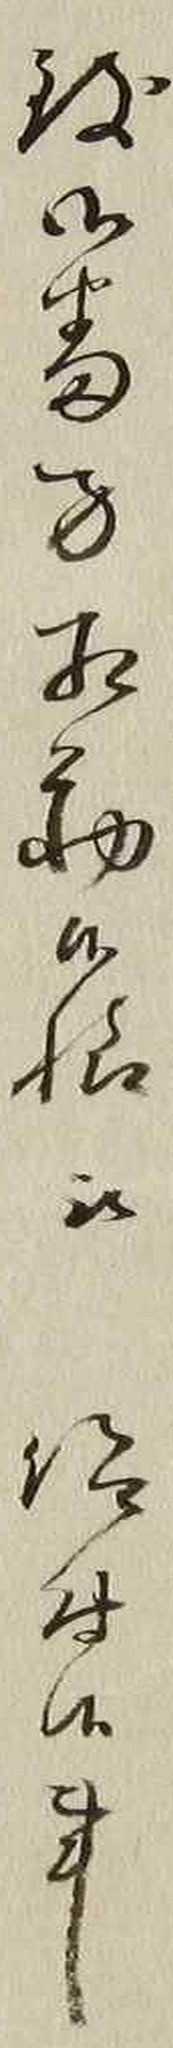致御番方相勤候様被仰付候事
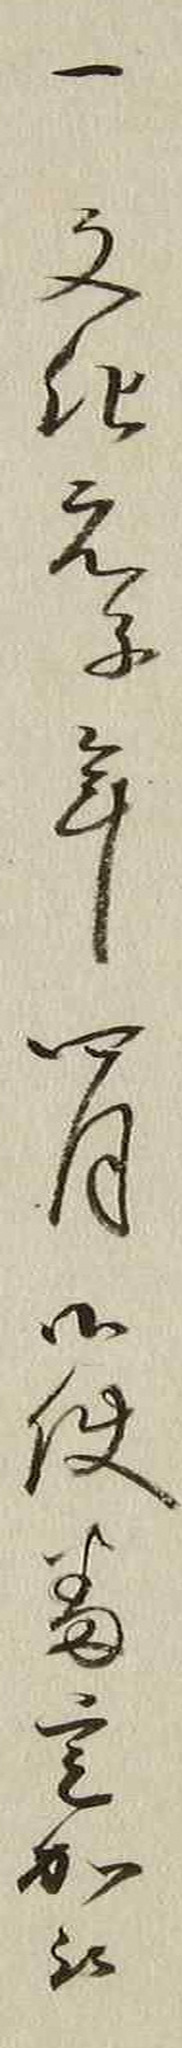一文化元子年四月御使番定加被
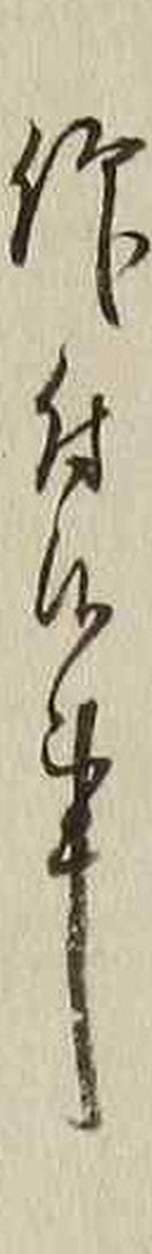仰付候事
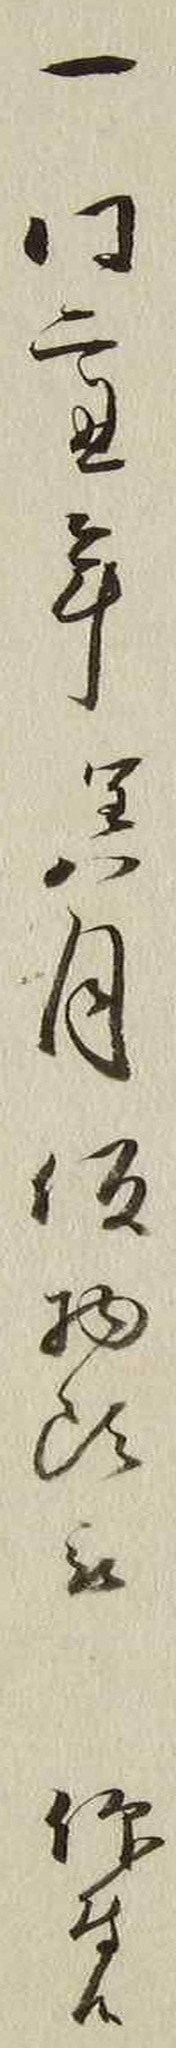一同二丑年閏八月仮物頭被仰付候
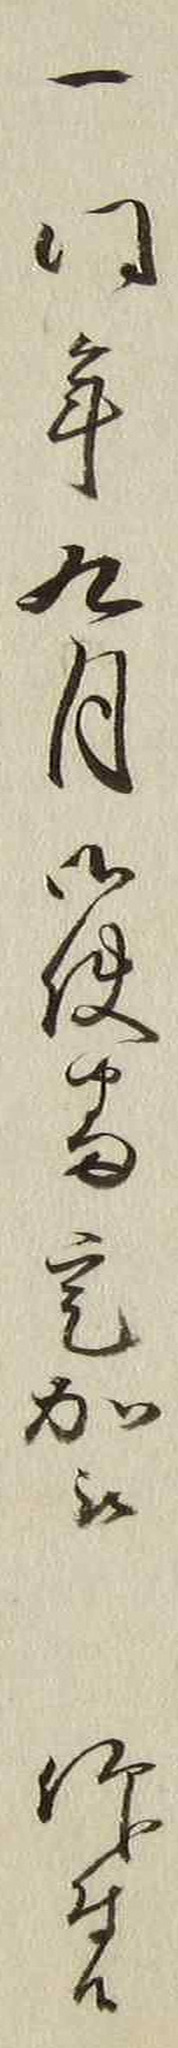一同年九月御使番定加被仰付候
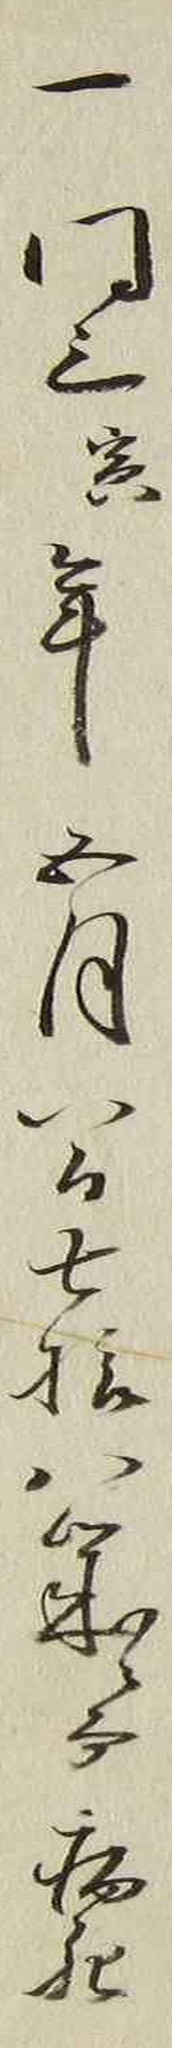一同三寅年五月八日七拾八歳ニ而病死
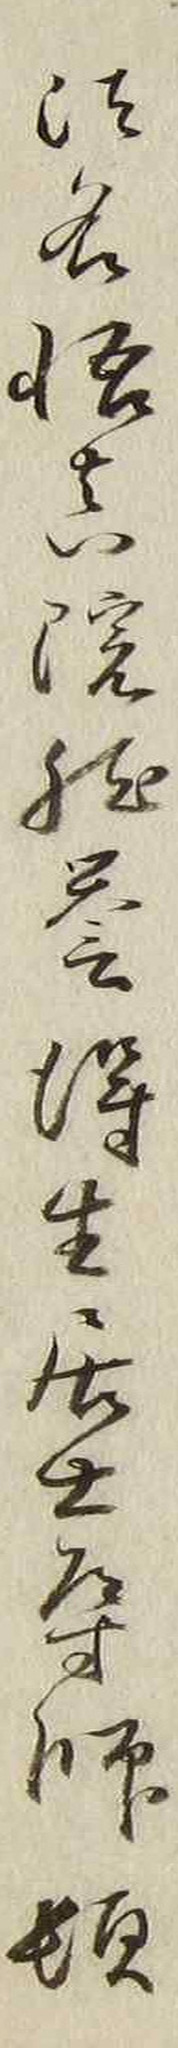法名悟真院然誉得生居士導師頓
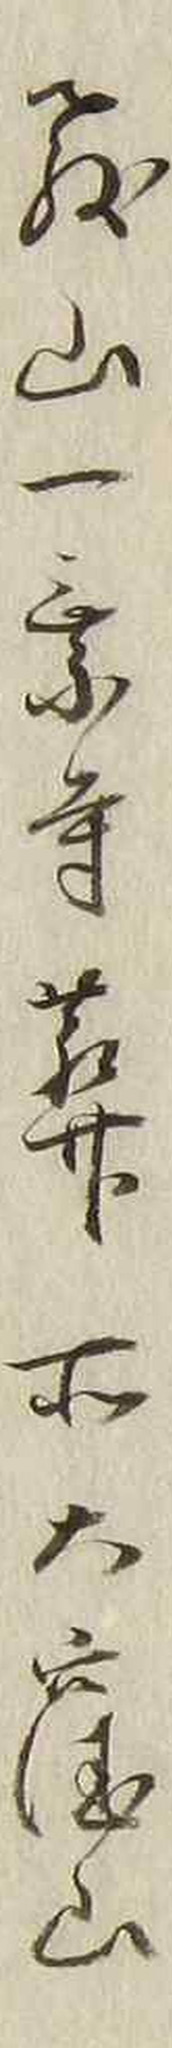教山一乗寺葬所大窪山

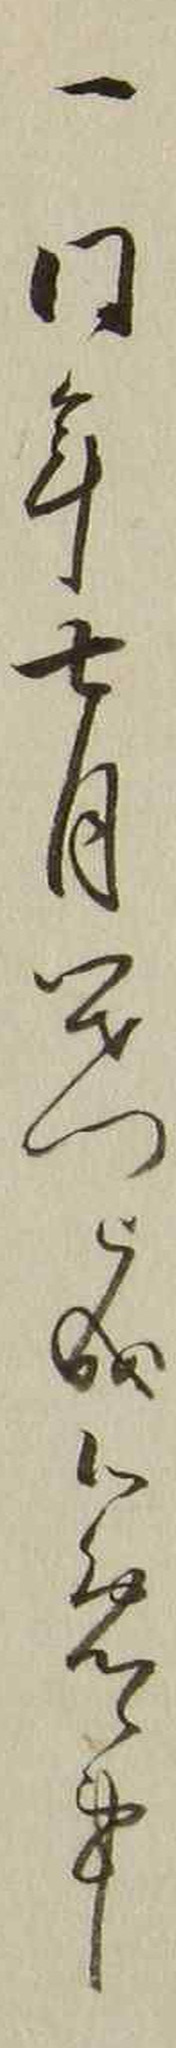一同年七月閉門被成御免候事
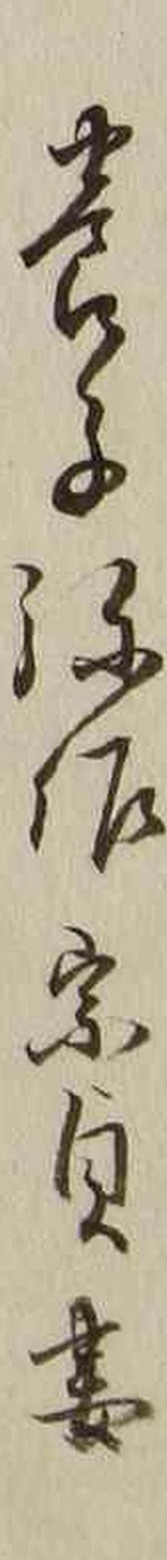女養子弥作宗貞妻
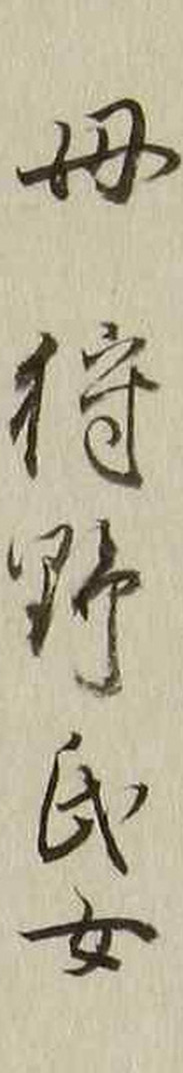母狩野氏女
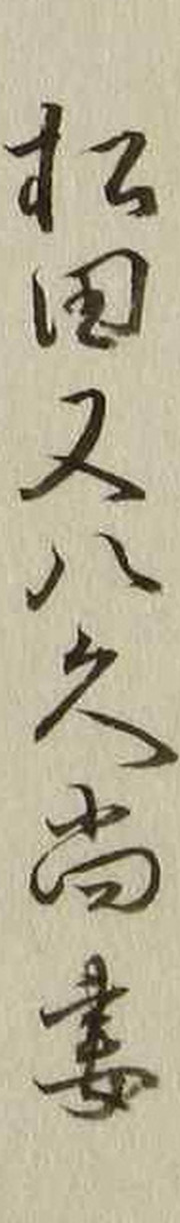女松田又八久尚妻
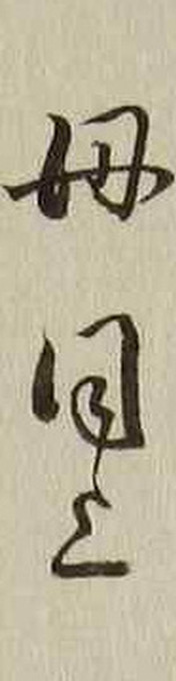母同上
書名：諸士系譜　巻之28　い之部28
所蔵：会津若松市立会津図書館
